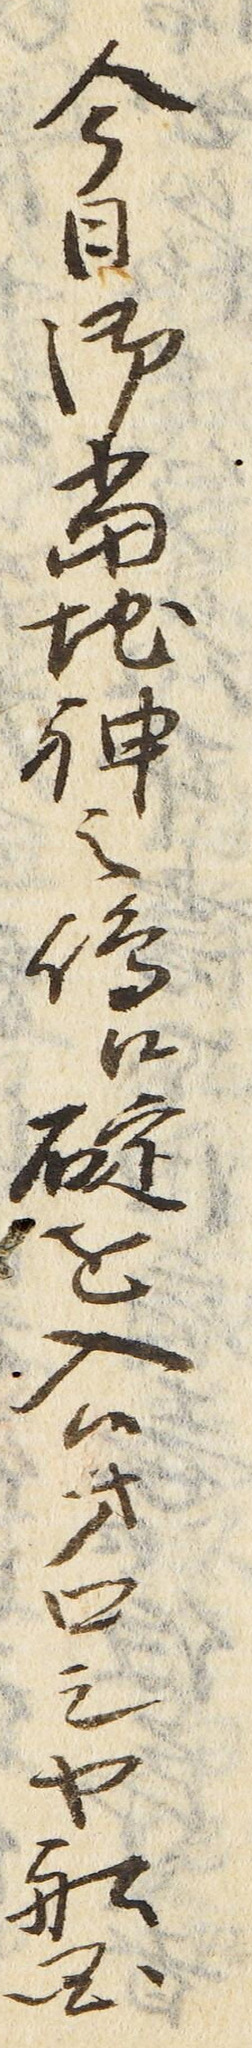今日御当地神之島え碇を入候オロシヤ船国
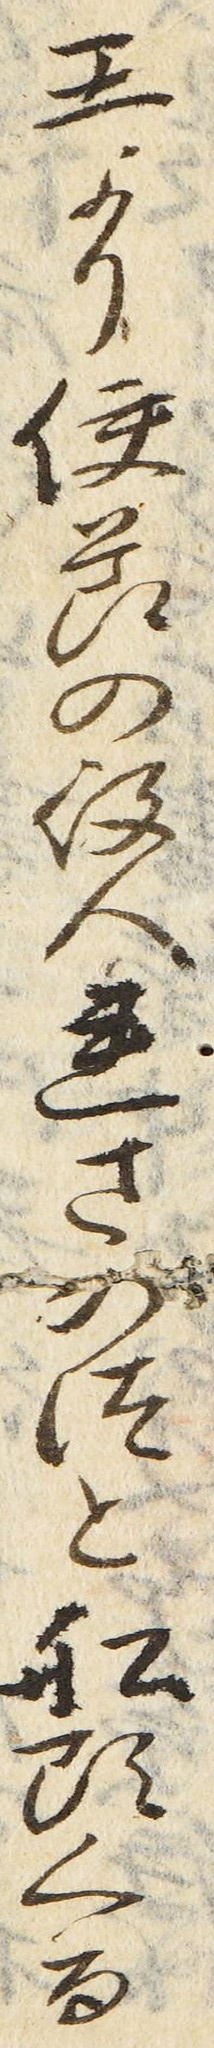王より使節の役人れさのつと船頭くる
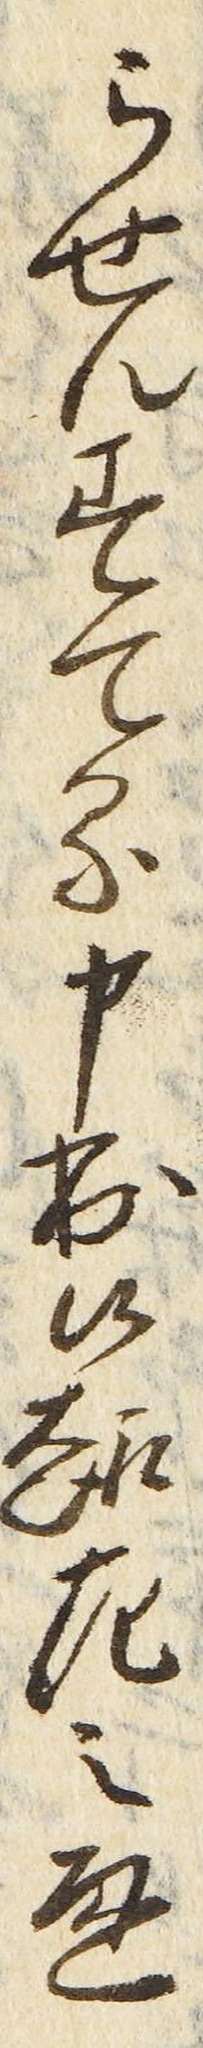らせんすてる申出候趣左之通
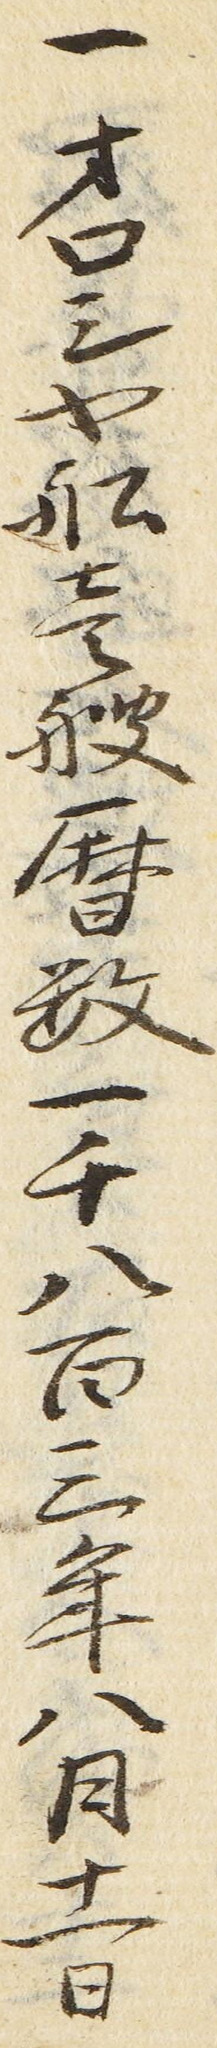一オロシヤ船壱艘暦数一千八百三年八月十一日
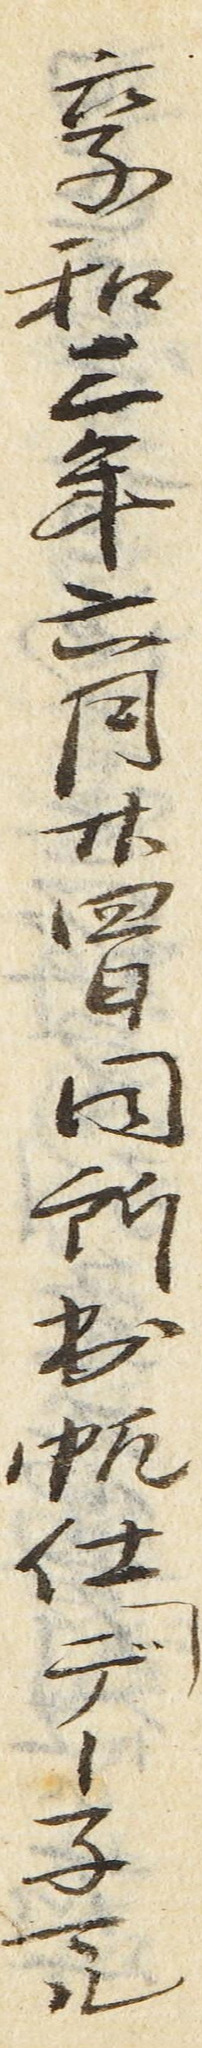享和三年六月廿四日同所出帆仕「デーネマル
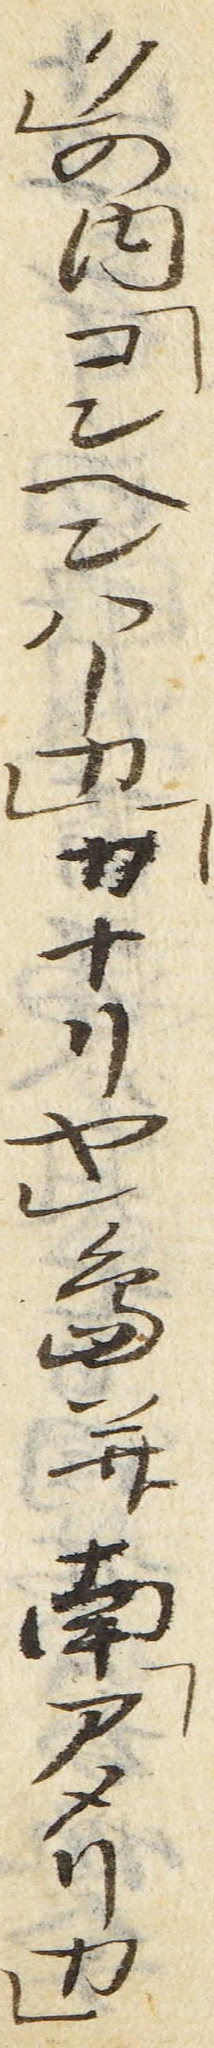ク」の内「コンヘンハーカ」「カナリヤ」島并南「アメリカ」
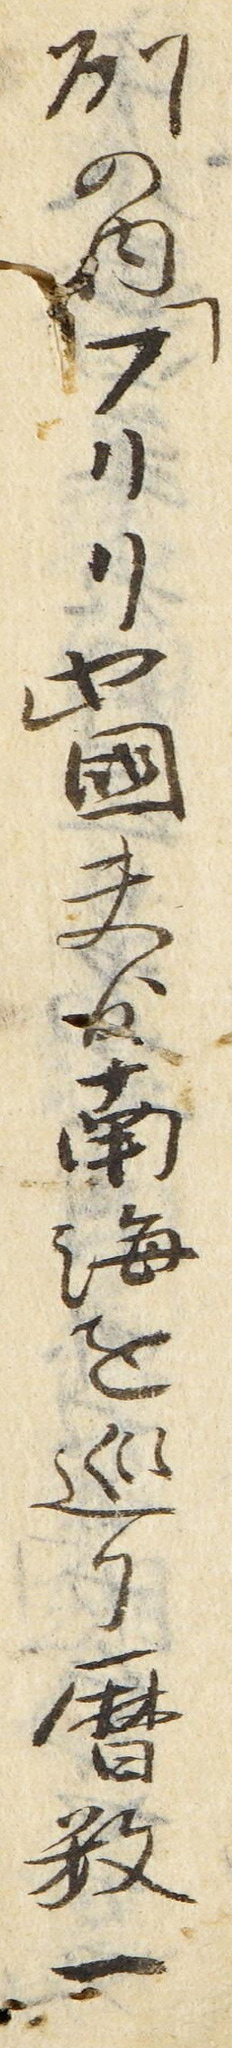州の内「フリリヤ」国夫ゟ南海を巡リ暦数一

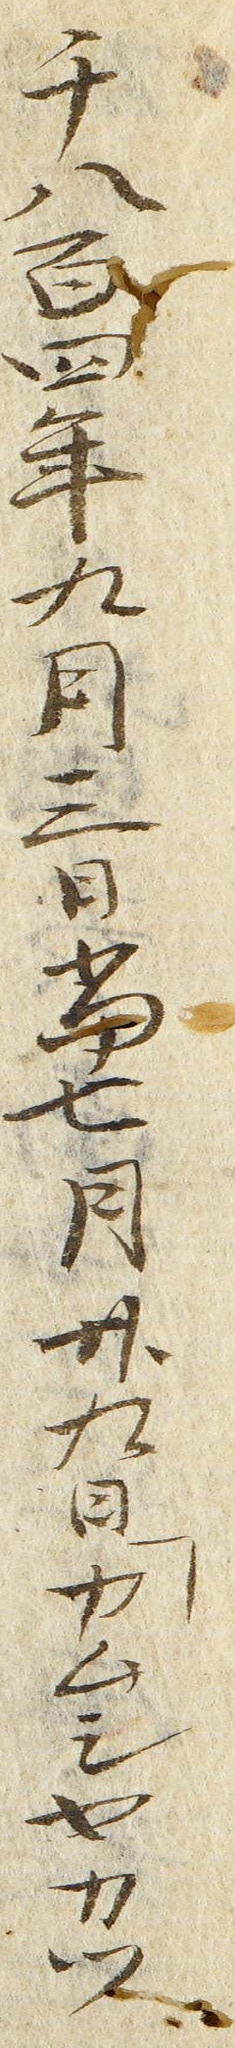千八百四年九月三日当七月廿九日「カムシヤカツ
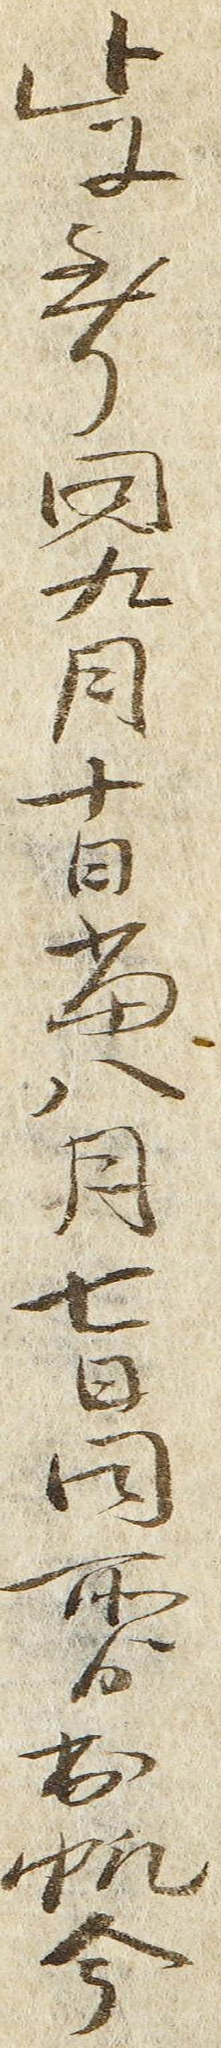ト」に至り同九月十日当八月七日同所ゟ出帆今
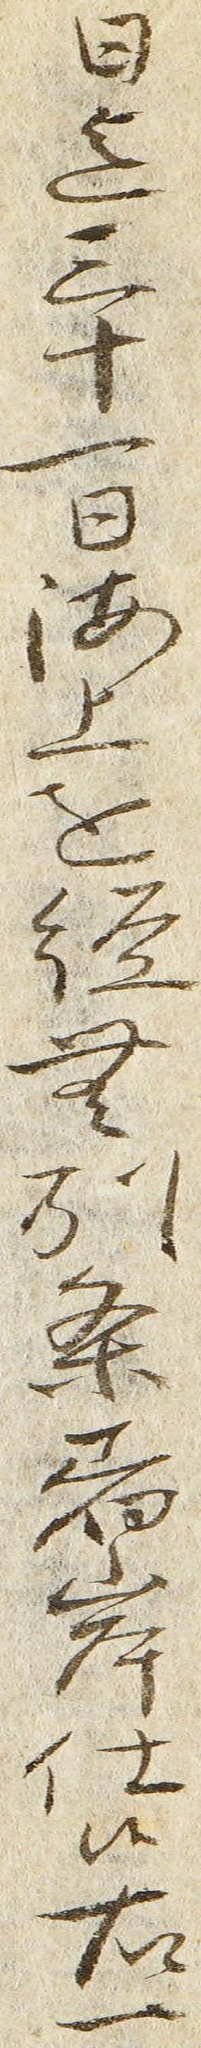日迄三十一日海上を経無別条着岸仕候右一
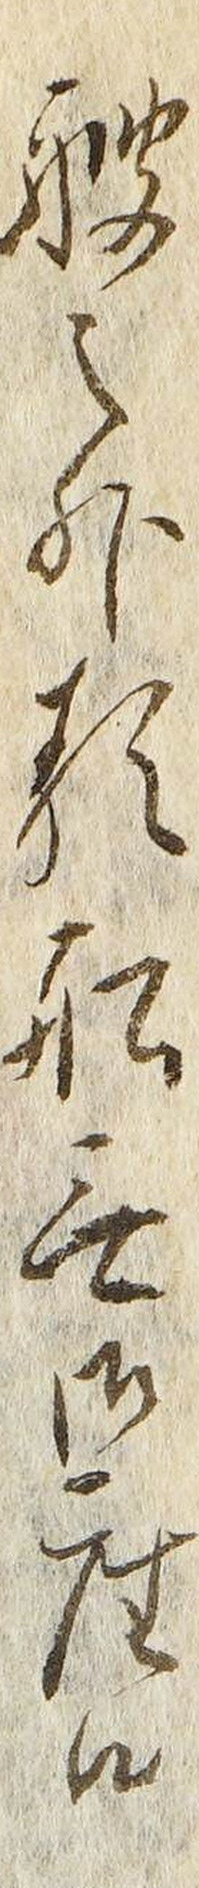艘之外類船無御座候
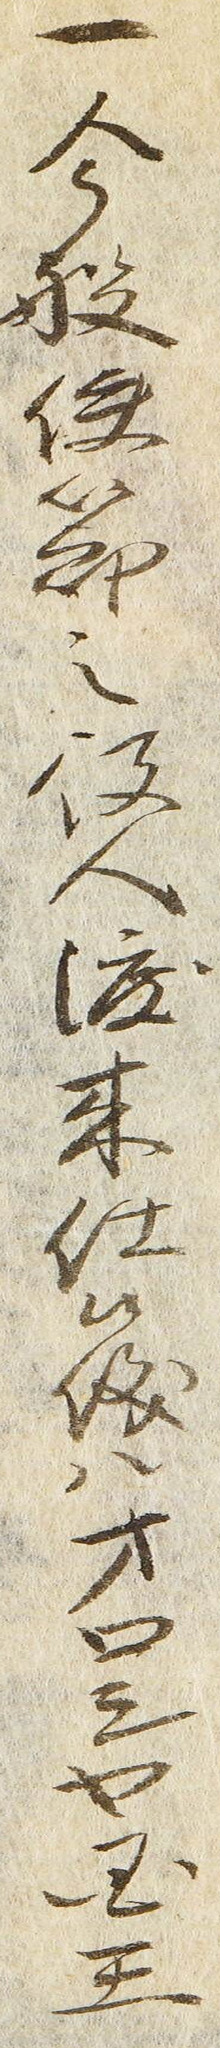一今般使節之役人渡来仕候儀はオロシヤ国王
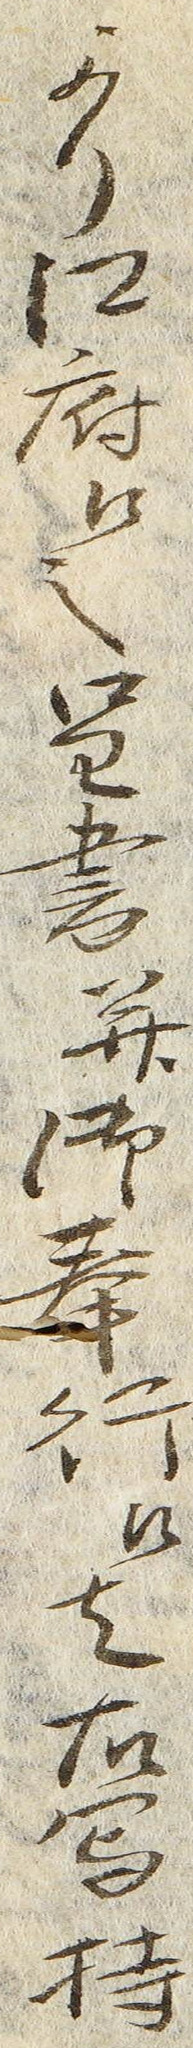より江府え之呈書并御奉行えは右写持
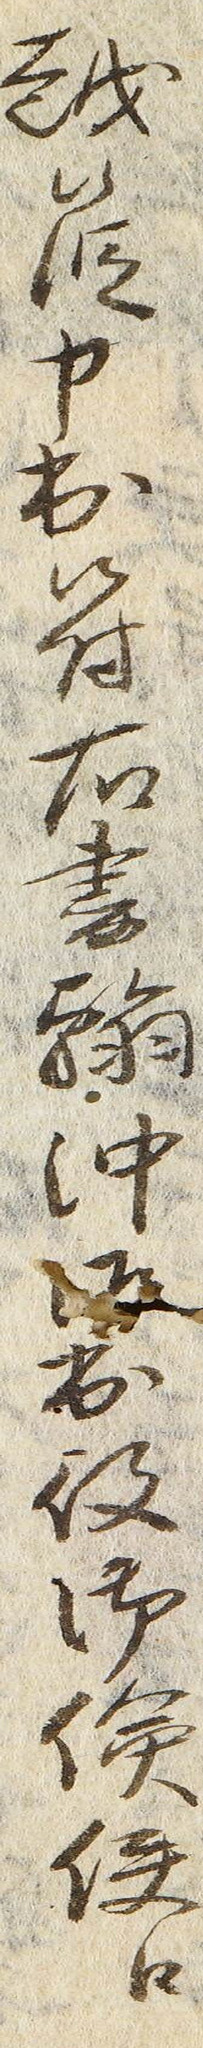越候段申出候付右書翰沖御出役御検使え
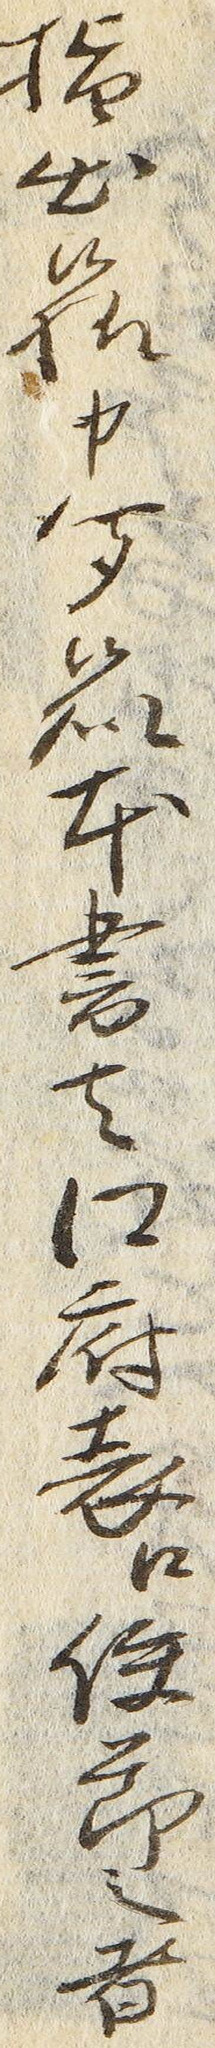指出候様申聞候処本書は江府表え使節之者
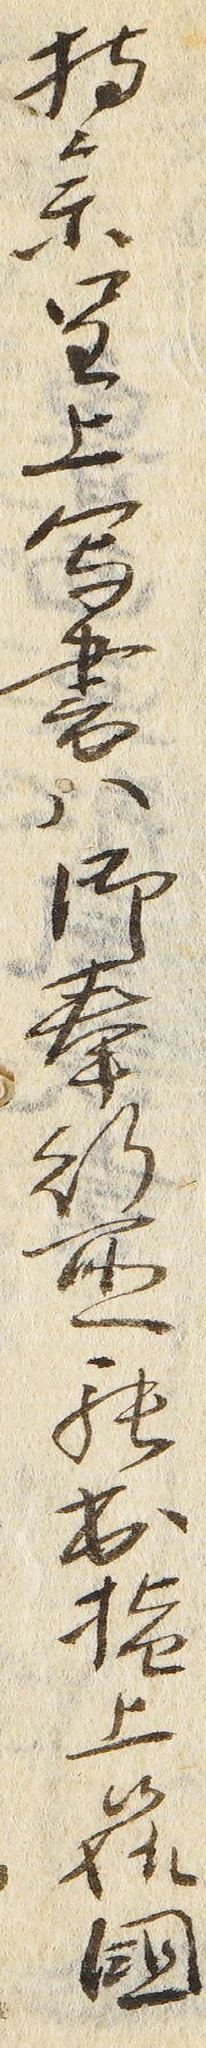持参呈上写書は御奉行所へ罷出指上候様国
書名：漂民後記
